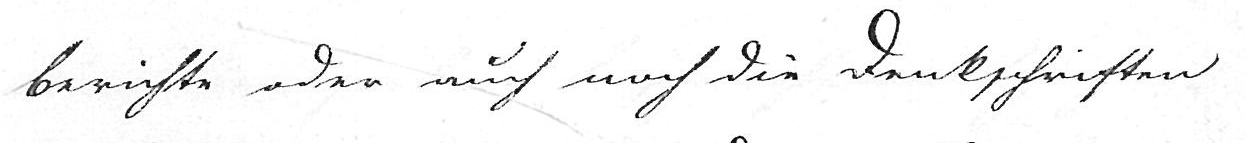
berichte oder auch noch die Denkschriften
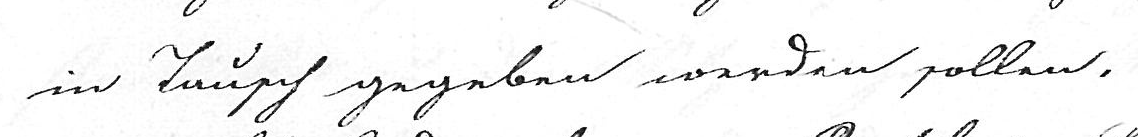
in Tausch gegeben werden sollen.
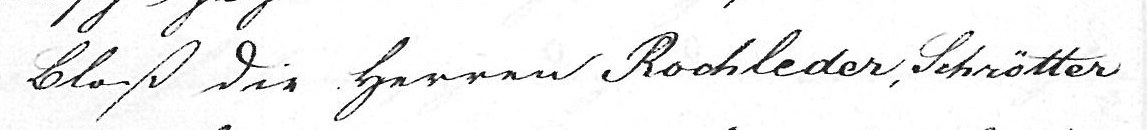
Bloß die Herren Rochleder, Schrötter
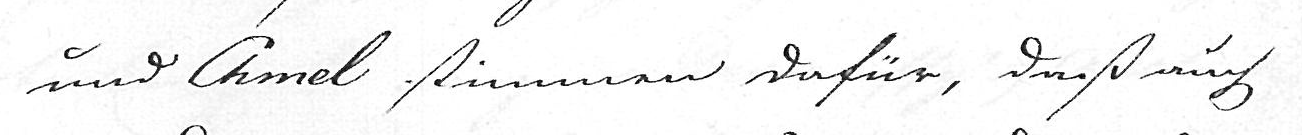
und Chmel stimmen dafür, daß auch
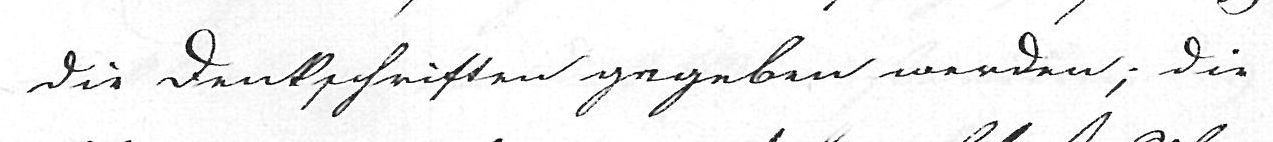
die Denkschriften gegeben werden; die
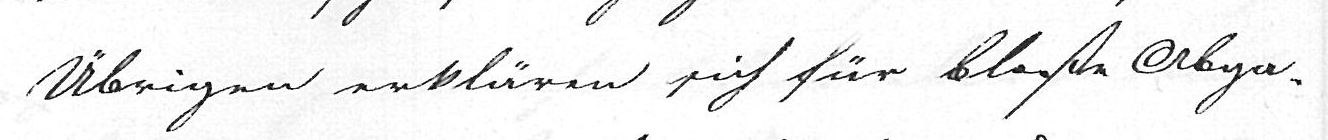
Übrigen erklären sich für bloße Abga-
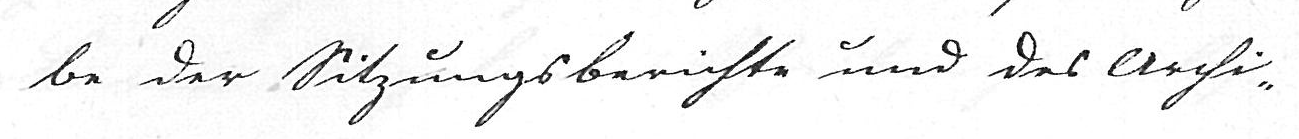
be der Sitzungsberichte und des Archi-
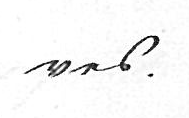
ves.
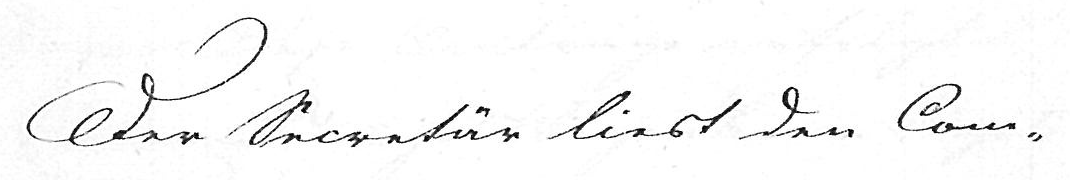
Der Secretär liest den Com-
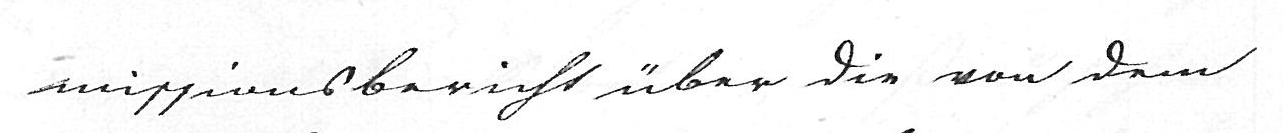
missionsbericht über die von dem
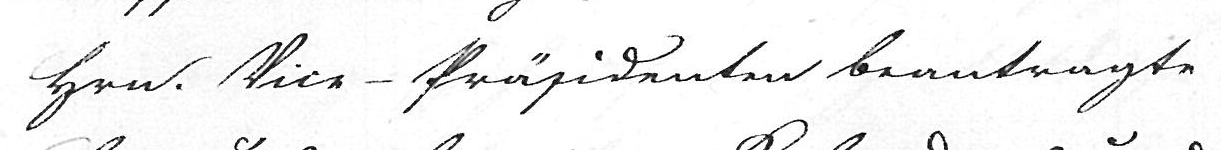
Hrn. Vice-Präsidenten beantragte
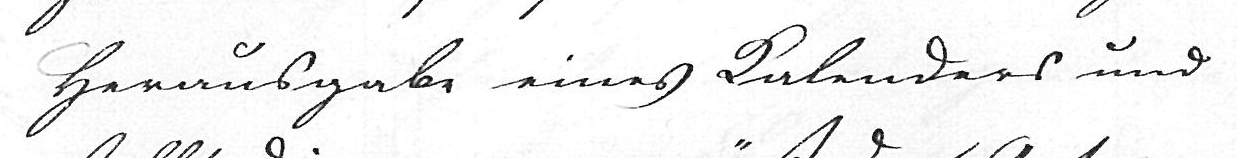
Herausgabe eines Kalenders und
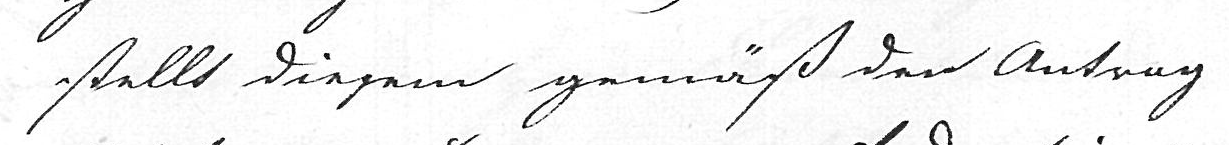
stellt diesem gemäß den Antrag
